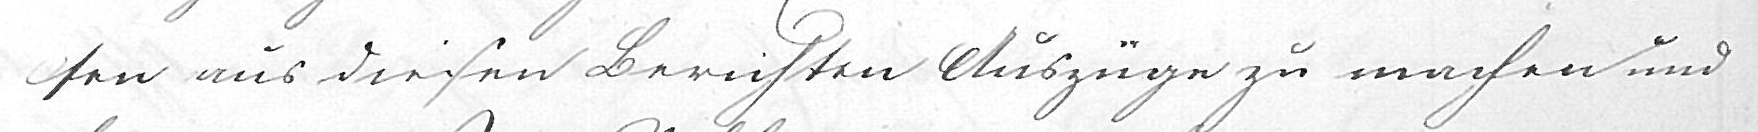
sen aus diesen Berichten Auszüge zu machen und
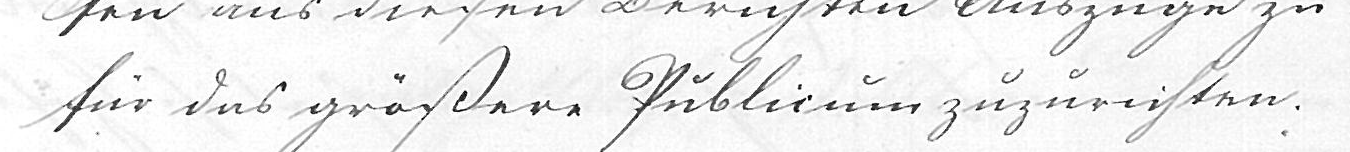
für das größere Publicum zuzurichten.
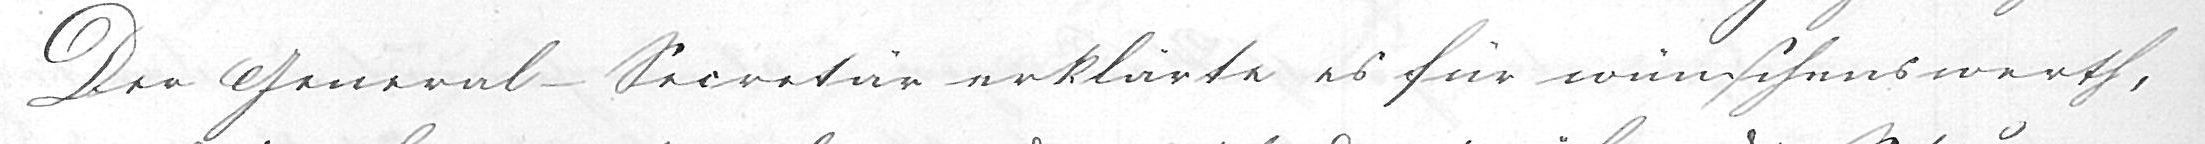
Der General Secretär erklärte es für wünschenwerth,
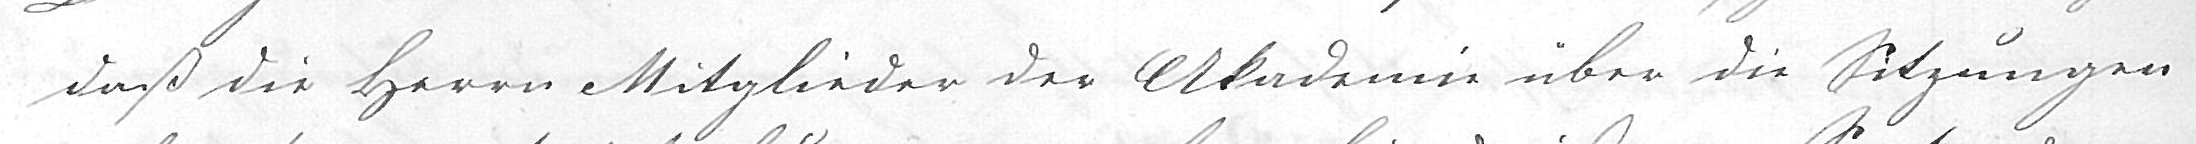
daß die Herrn Mitglieder der Akademie über die Sitzungen
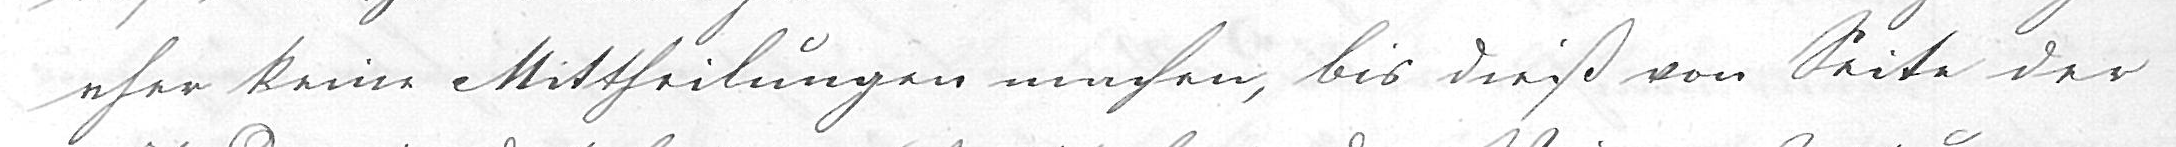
eher keine Mittheilungen machen, bis dieß von Seite der
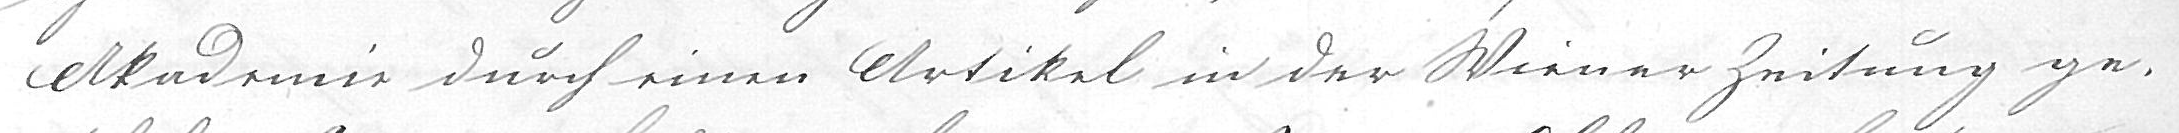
Akademie durch einen Artikel in der Wiener Zeitung ge-
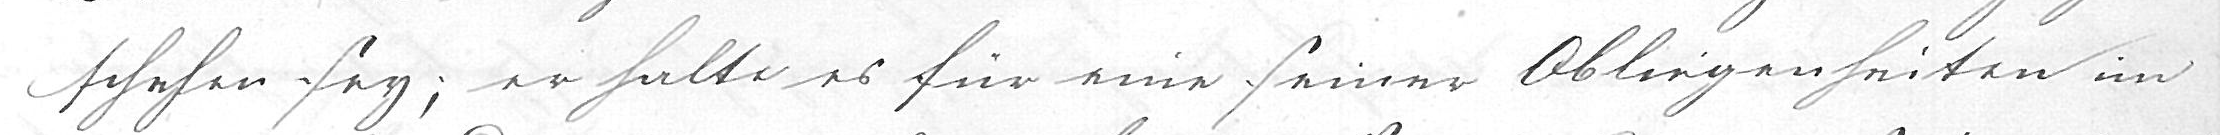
schehen sey; er halte es für eine seiner Obliegenheiten im
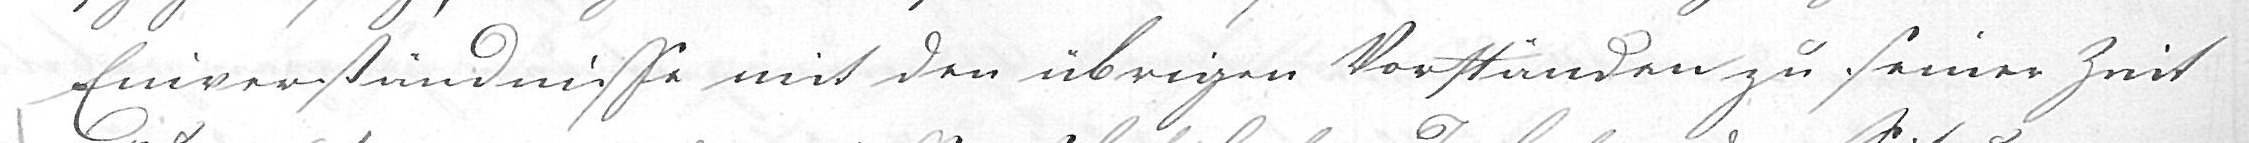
Einverständnisse mit den übrigen Vorständen zu seiner Zeit
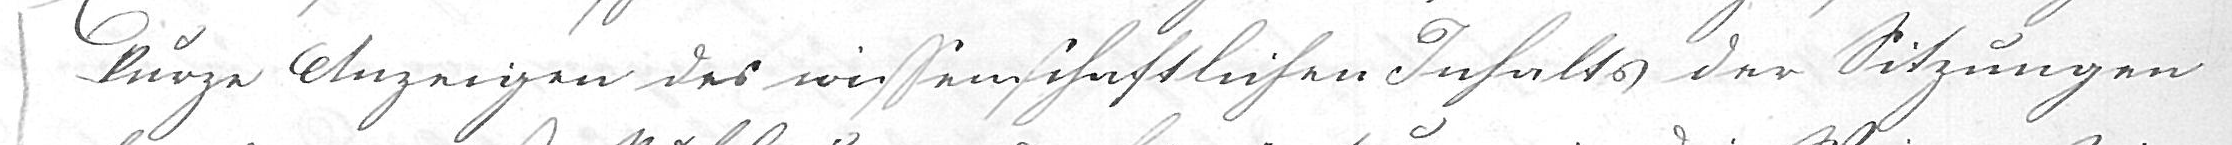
kurze Anzeigen des wissenschaftlichen Inhalts der Sitzungen
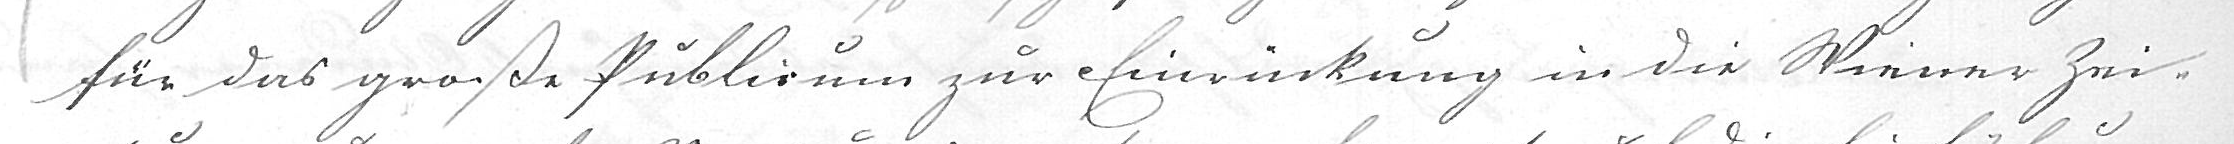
für das große Publicum zur Einrückung in die Wiener Zei-
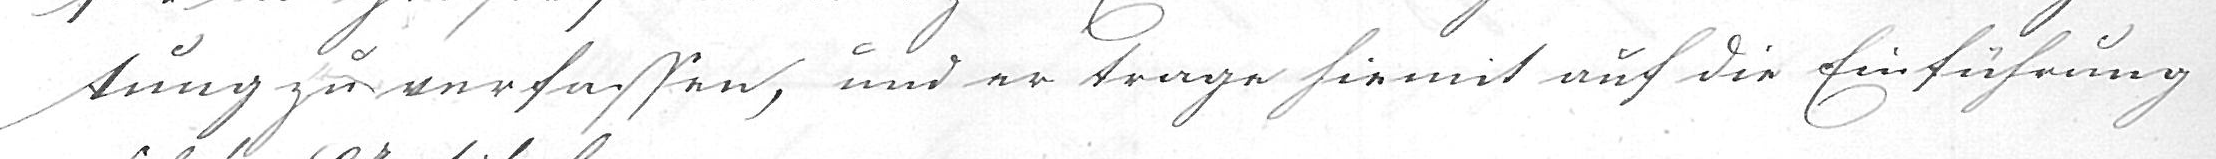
tund zu verfassen, und er trage hiemit auf die Einführung
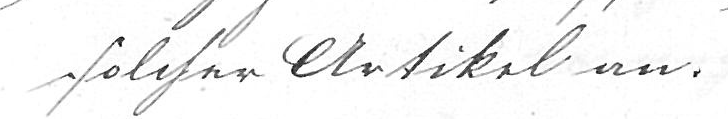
solcher Artikel an.
